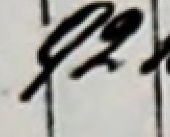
92
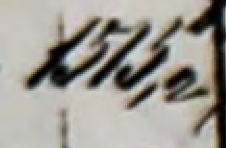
1515,2
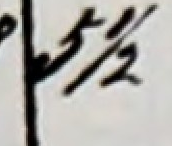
5 1/2
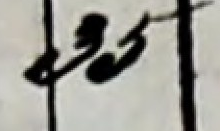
35
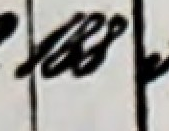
188
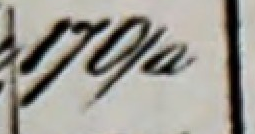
170/a
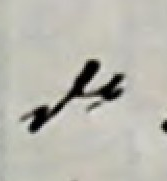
Do
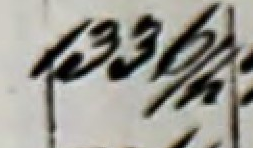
1336/h
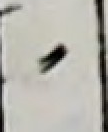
„
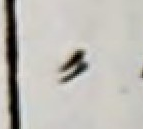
„
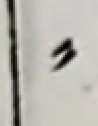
„
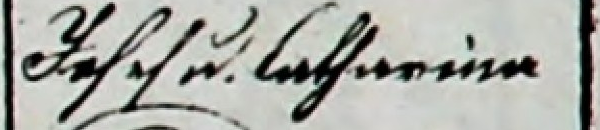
Josef u. Catharina
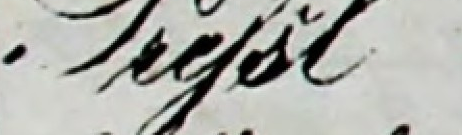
Dressl
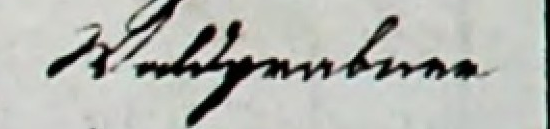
Waldgrabner
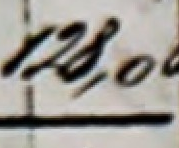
128,0
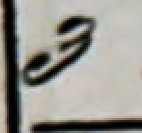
3
